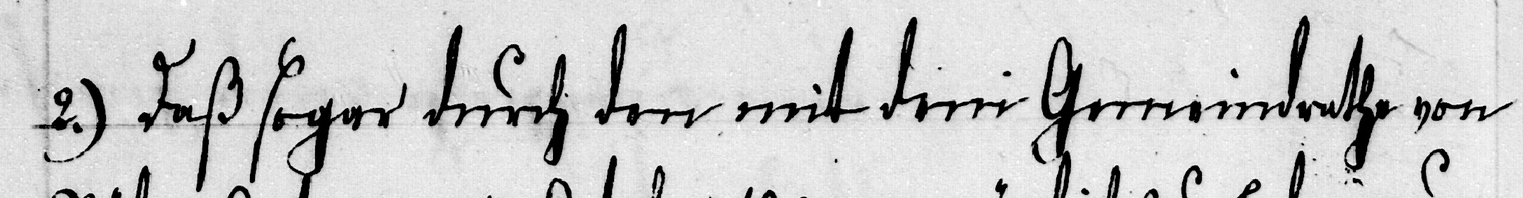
2.) Daß sogar durch den mit dem Gemeindrathe von
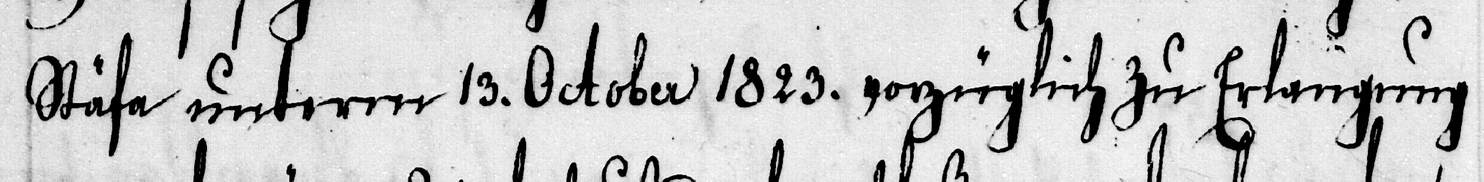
Stäfa unterm 13. October 1823. vorzüglich zu Erlangung
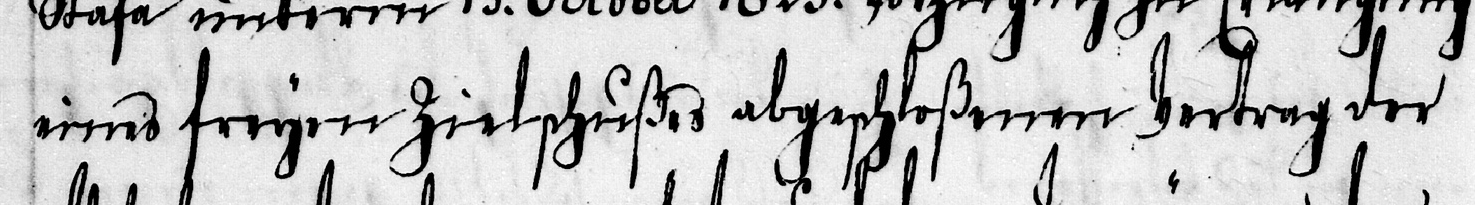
eines freyen Zielschußes abgeschloßenen Vertrag der
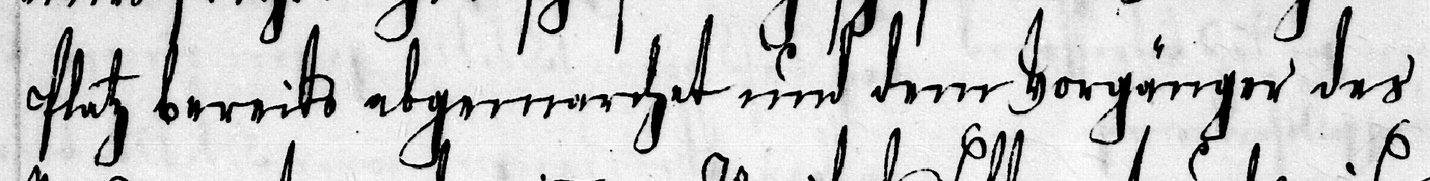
Platz bereits abgemarchet und dem Vorgänger des
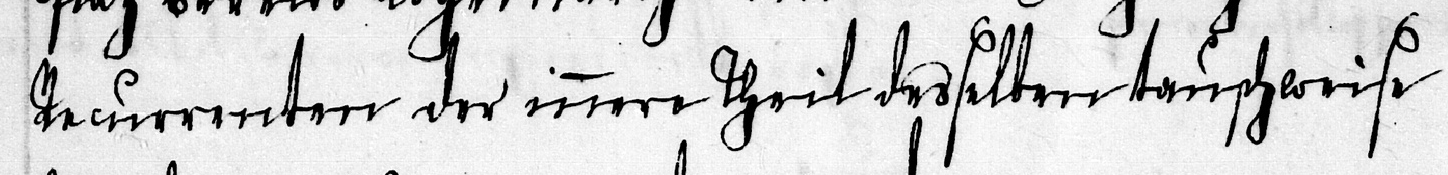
Recurrenten der innere Theil desselben tauschweise
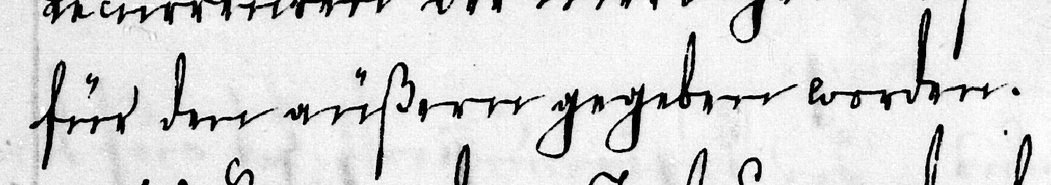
für den äußern gegeben worden.
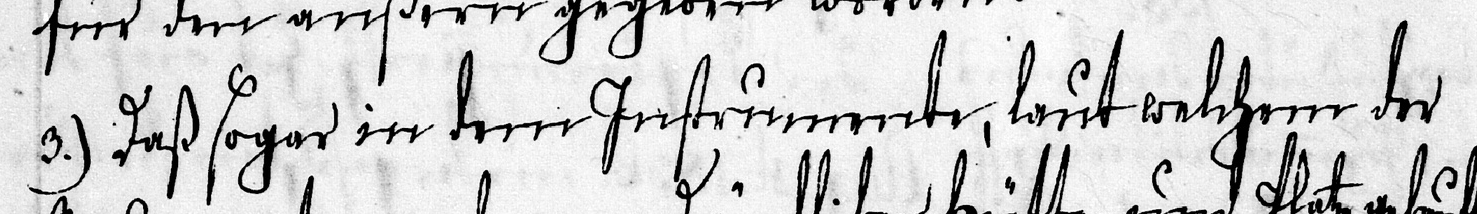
3.) Daß sogar in dem Instrumente, laut welchem der
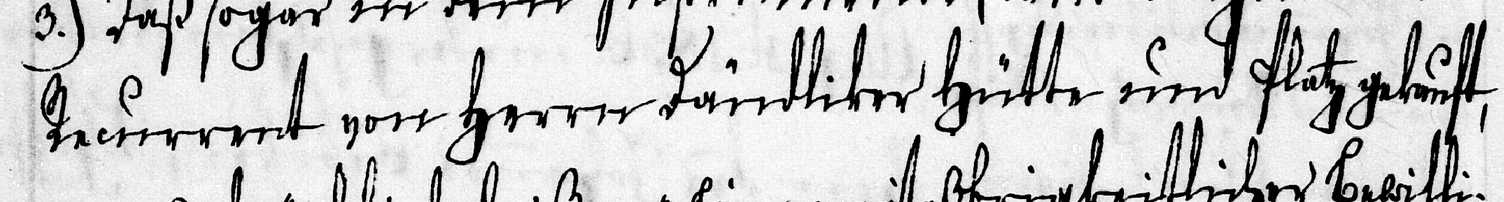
Recurrent von Herrn Dändliker Hütte und Platz gekauf¬
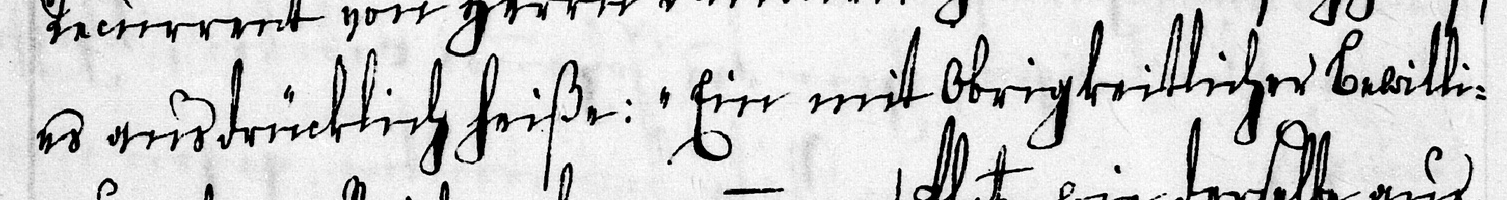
es ausdrücklich heiße: „Ein mit Obrigkeitlicher Bewilli¬
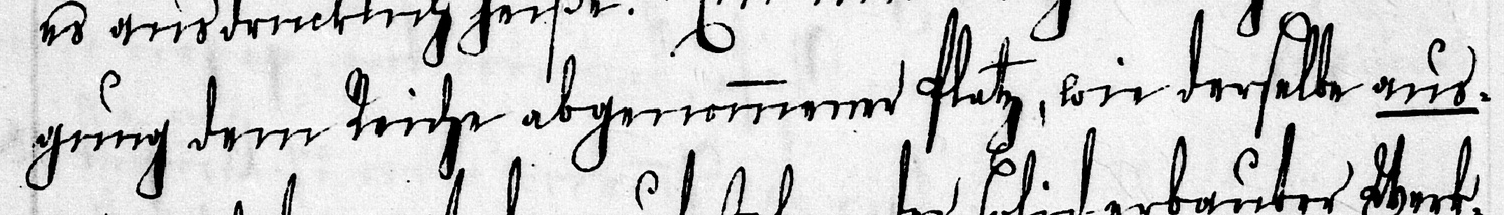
gung dem Reiche abgenommener Platz, wie derselbe aus¬
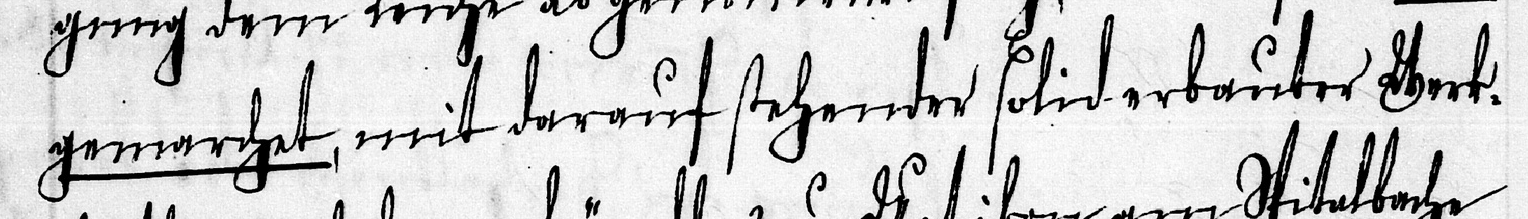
gemarchet, mit darauf stehender solid erbauter Werk¬
